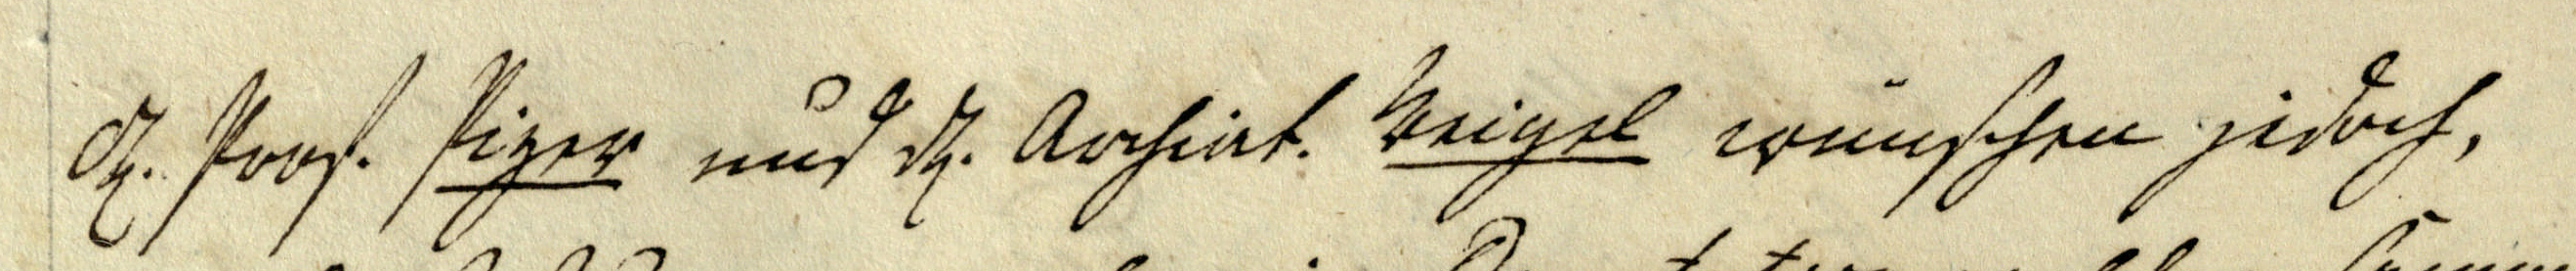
dh. Prof. Piper und dh. Archiat. Weigel wünschen jedoch,
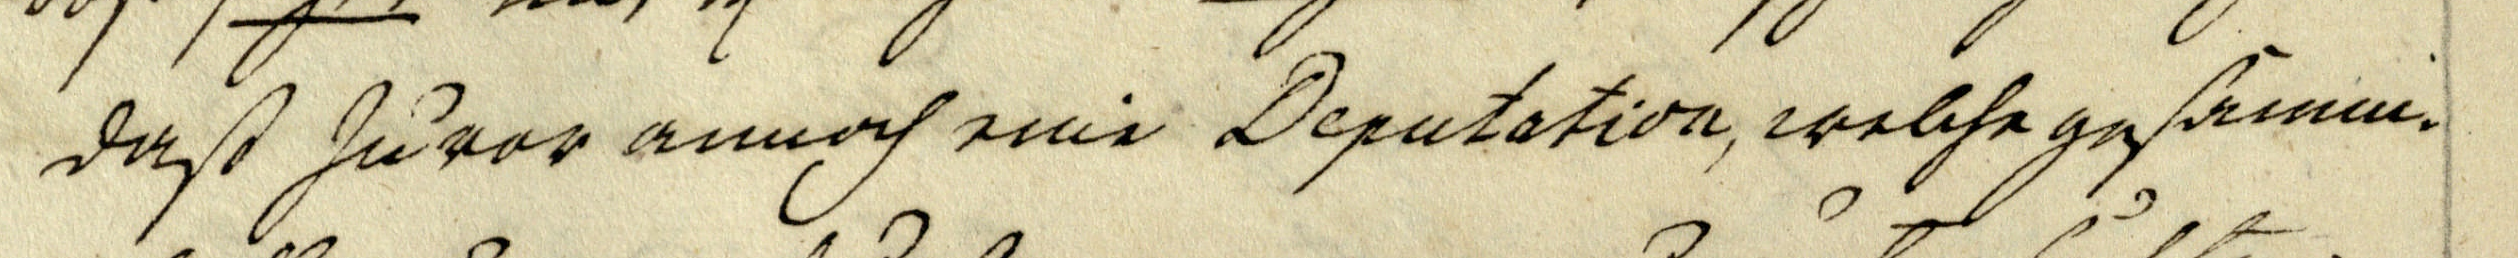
daß zuvor annoch eine Deputation, welche gesamm¬
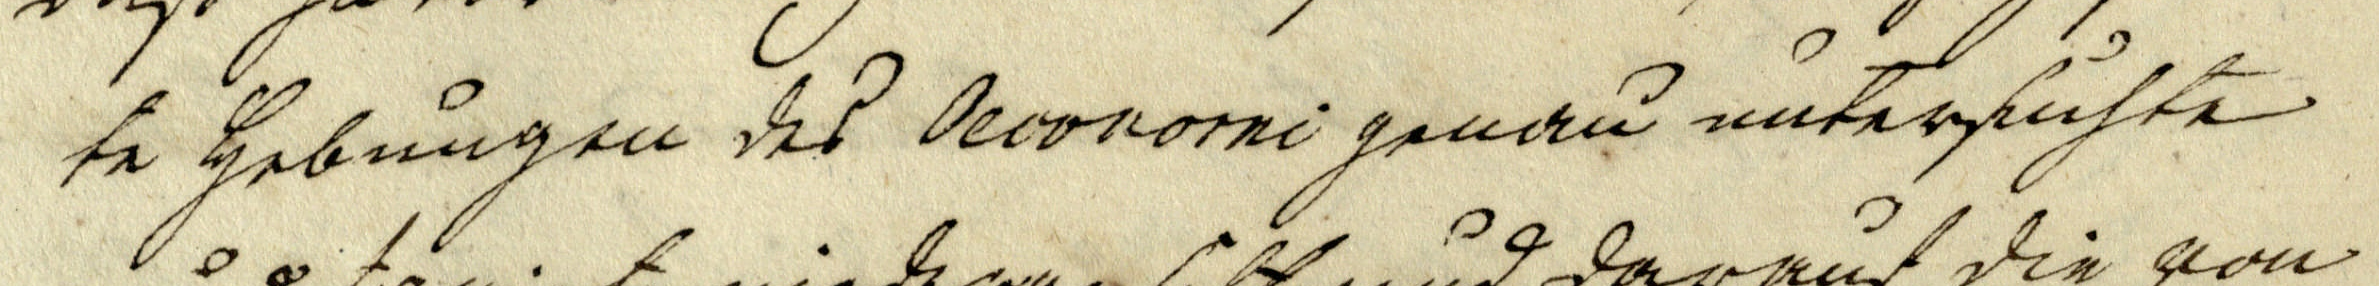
te Hebungen des Oeconomi genau untersuchte
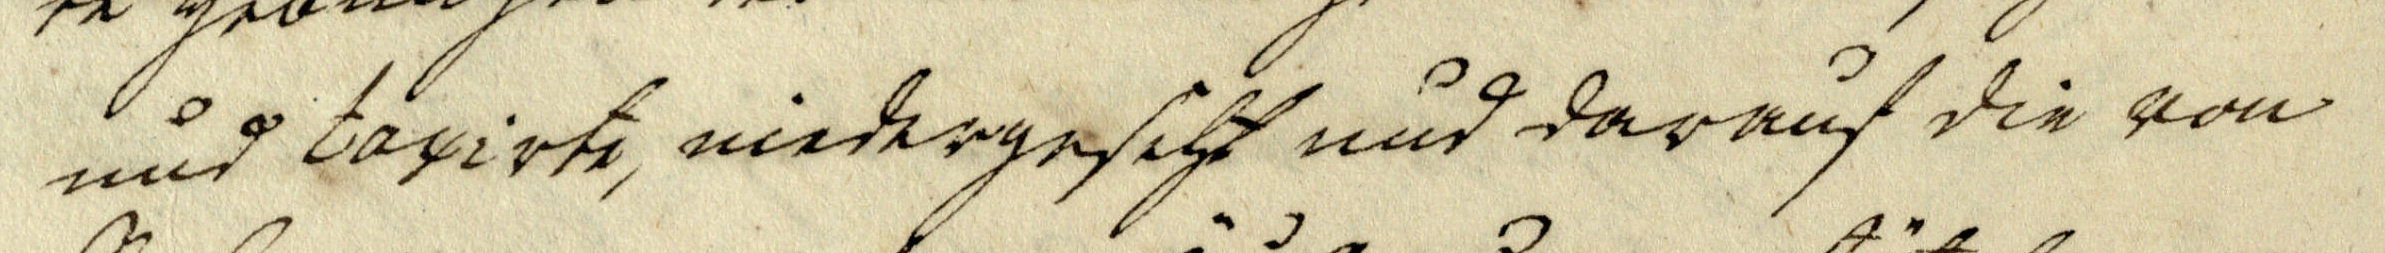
und taxirte, niedergesetzt und darauf die von
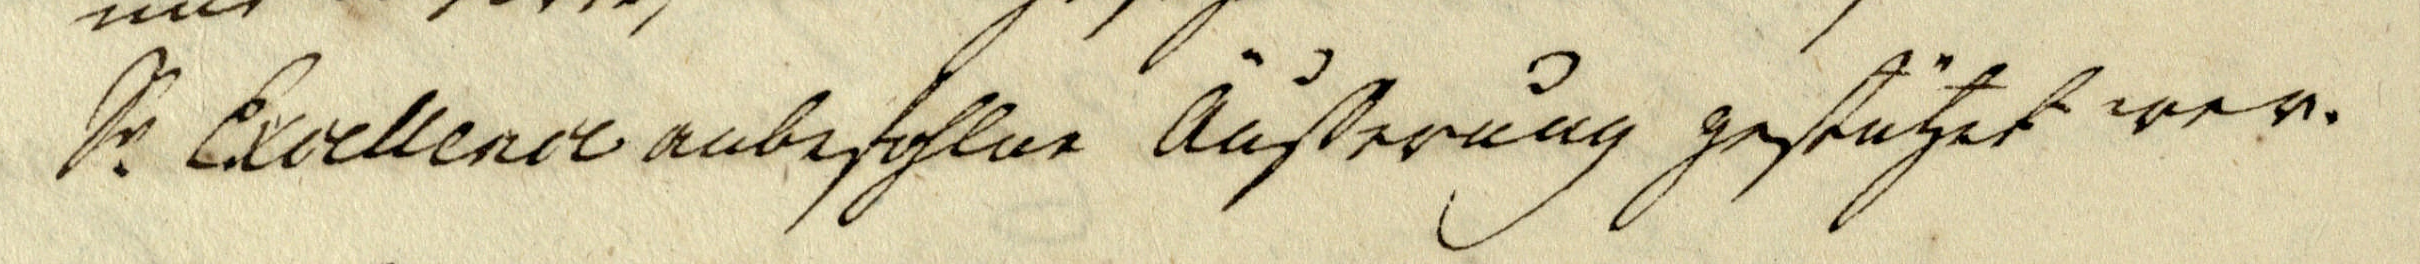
Sr. Excellence anbefohlne Äusserung gestützet wer¬
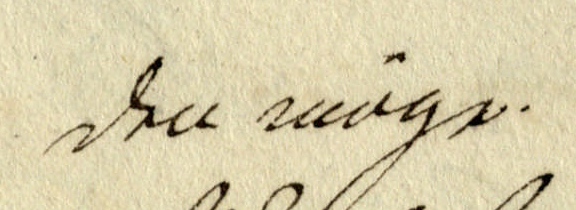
den möge.
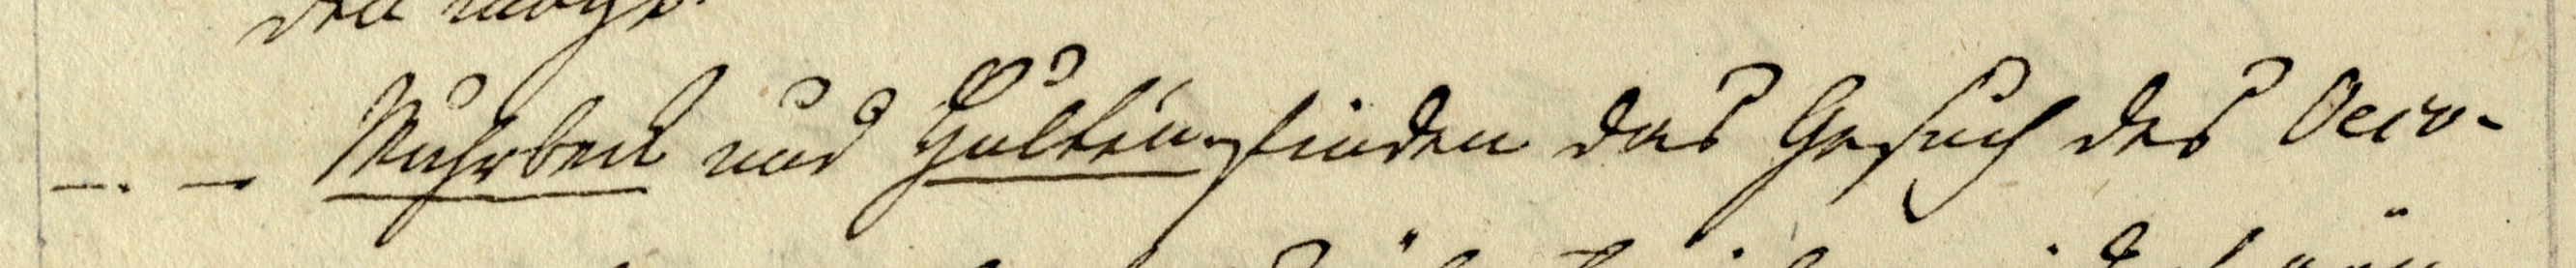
Muhrbeck und Hultén finden das Gesuch des Oeco¬
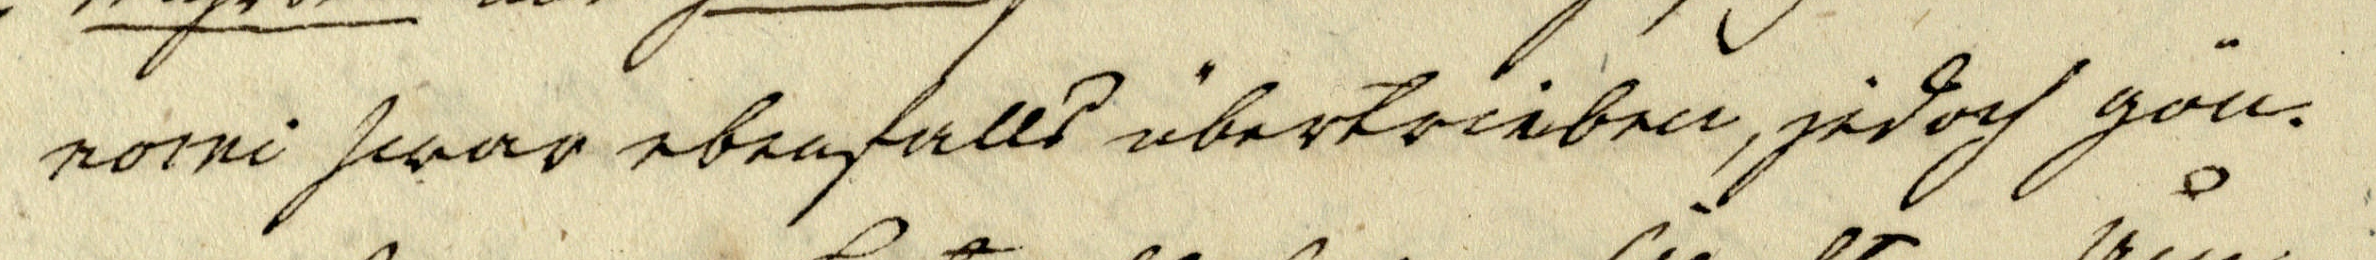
nomi zwar ebenfalls übertrieben, jedoch gön¬
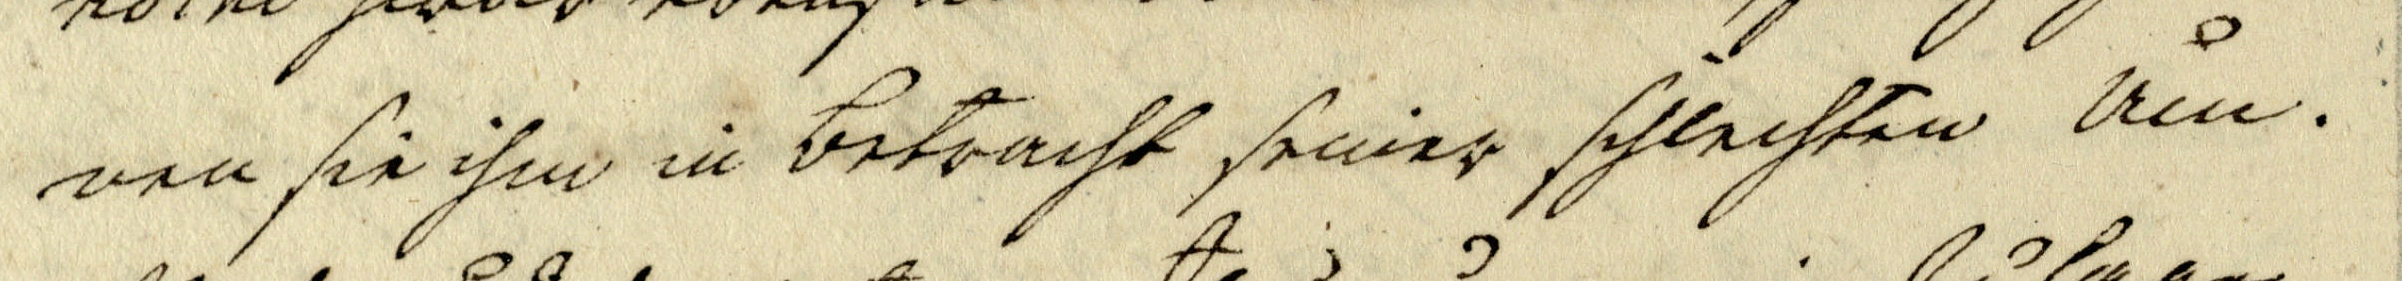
nen sie ihm in Betracht seiner schlechten Um¬
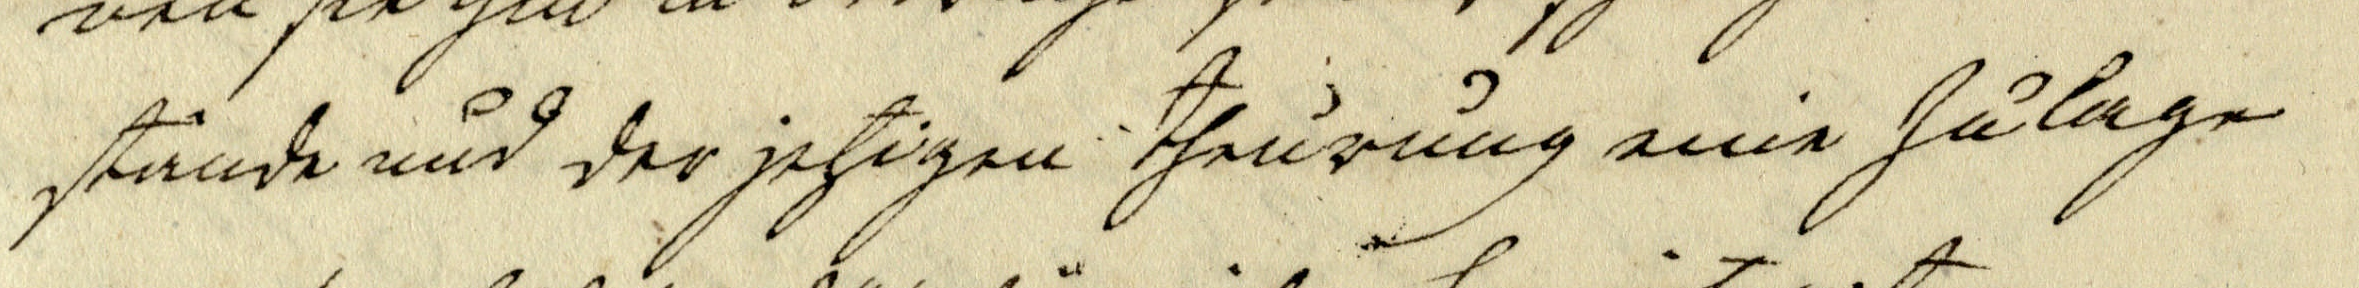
stände und der jetzigen Theurung eine Zulage
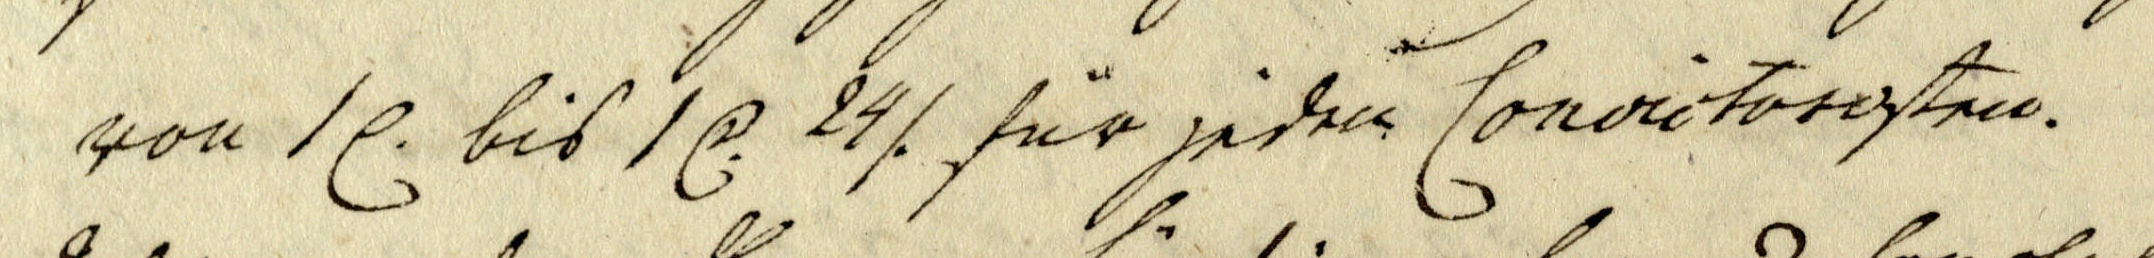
von 1 l. bis 1 l. 24 s. für jeden Convictoristen.
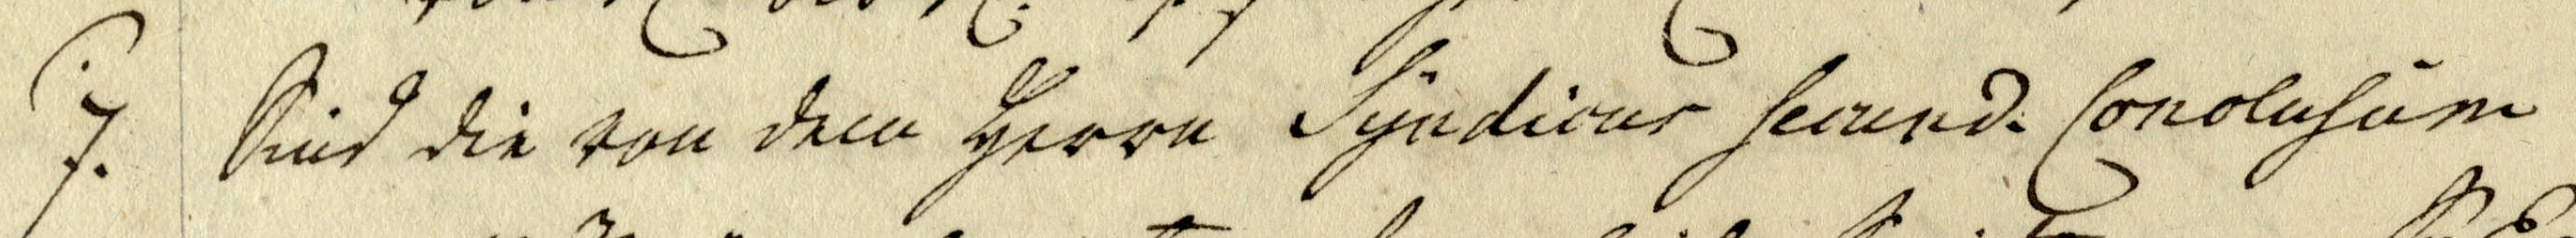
7. Sind die von dem Herrn Sÿndicus secund. Conclusum
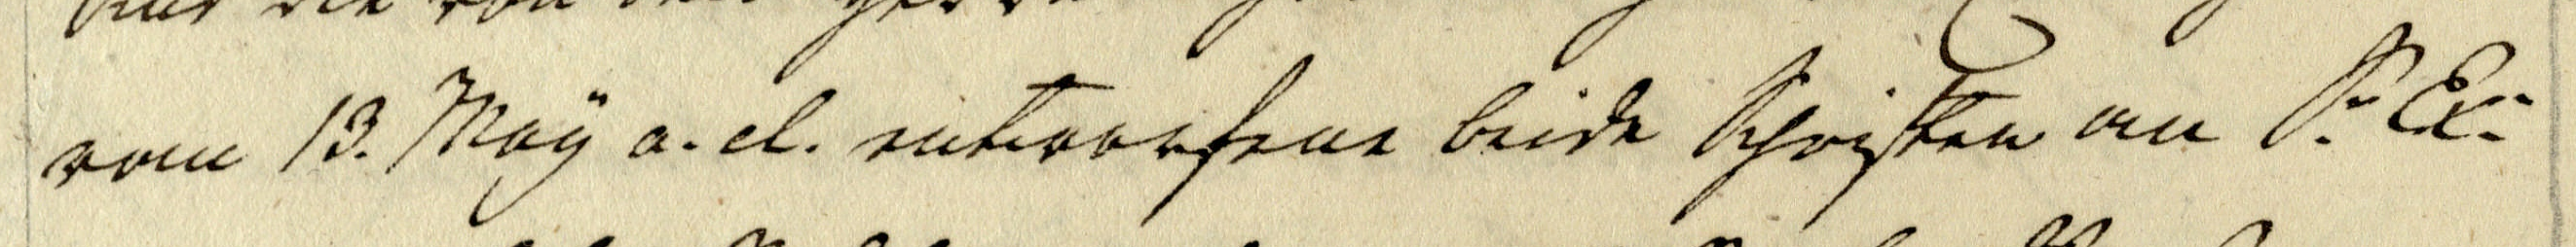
vom 13. Maÿ a. el. entworfene beide Schriften an Sr Ex¬
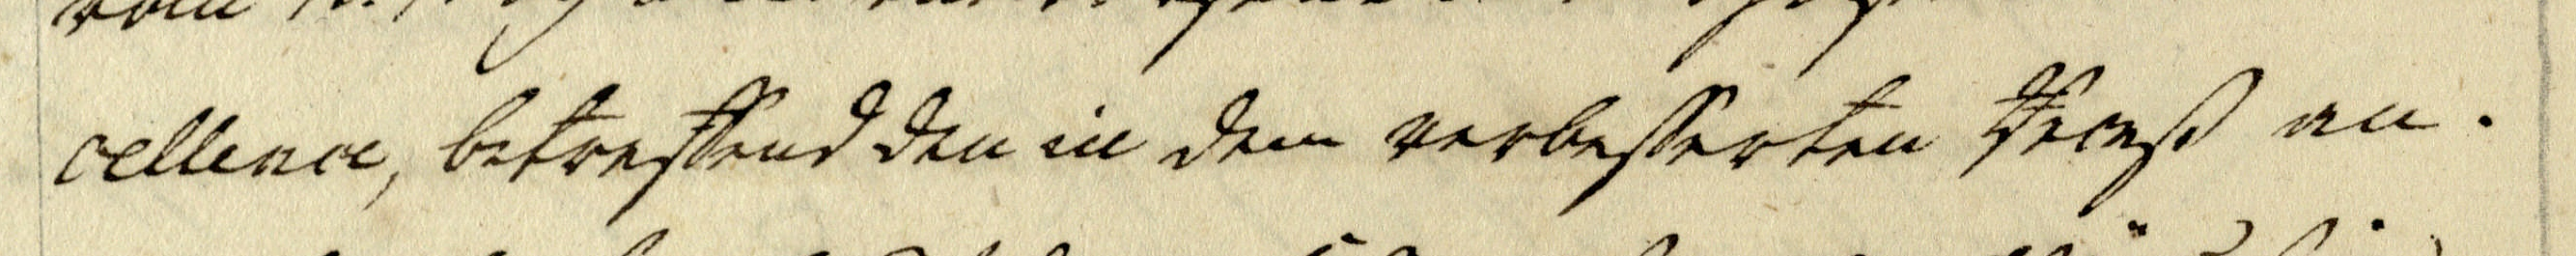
cellence, betreffend den in dem verbesserten Receß an¬
